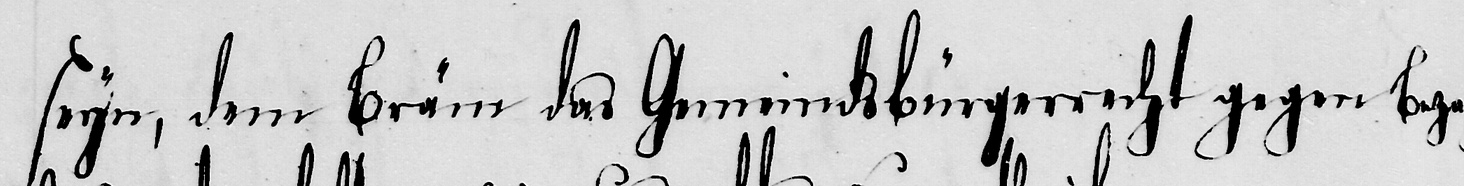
seyn, dem Bräm das Gemeindsbürgerrecht gegen Be¬
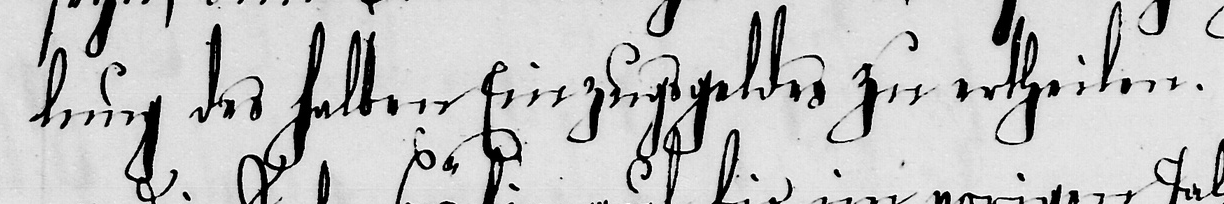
lung des halben Einzugsgeldes zu ertheilen.
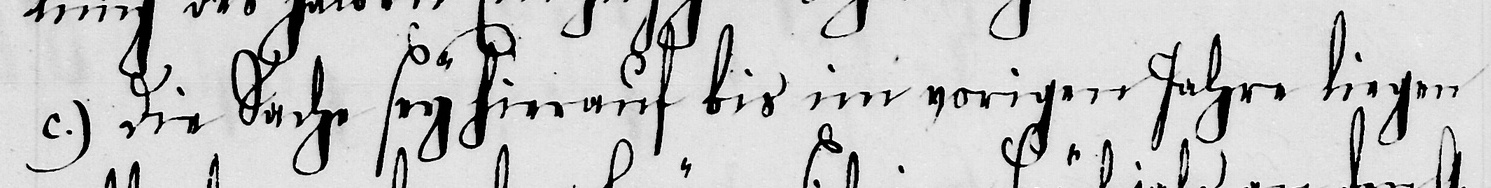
c.) Die Sache sey hierauf bis im vorigen Jahre liegen
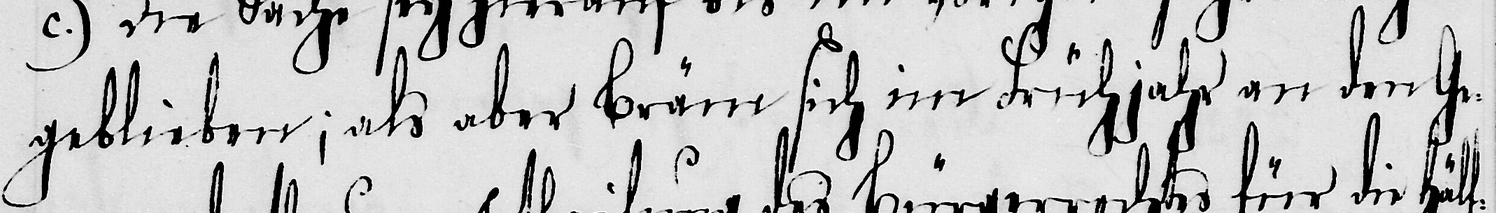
geblieben; als aber Bräm sich im Frühjahr an den Ge¬
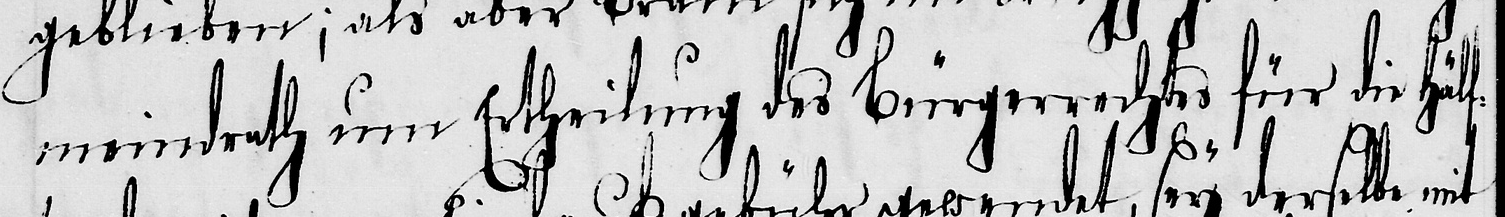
meindrath um Ertheilung des Bürgerrechtes für die Hä¬
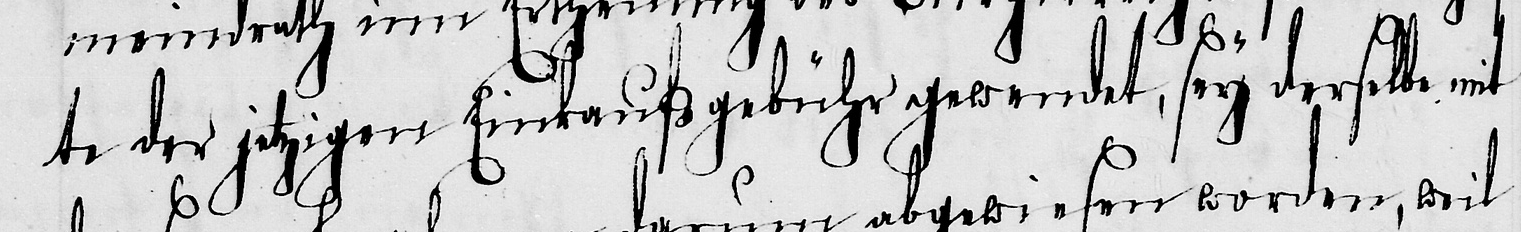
te der jetzigen Einkaufsgebühr gewendet, sey derselbe mit
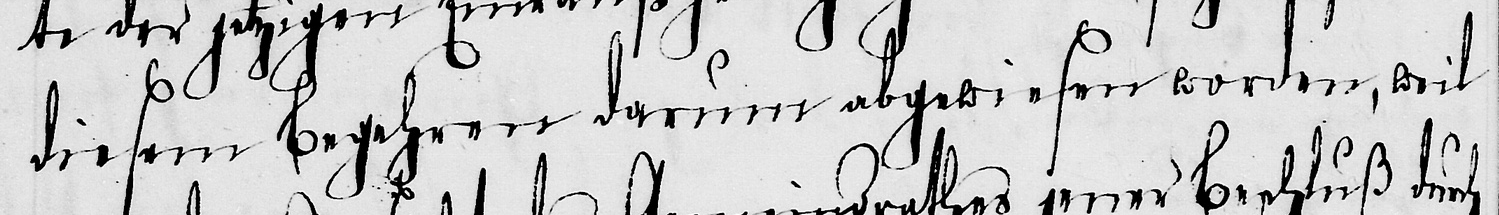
diesem Begehren darum abgewiesen worden, weil
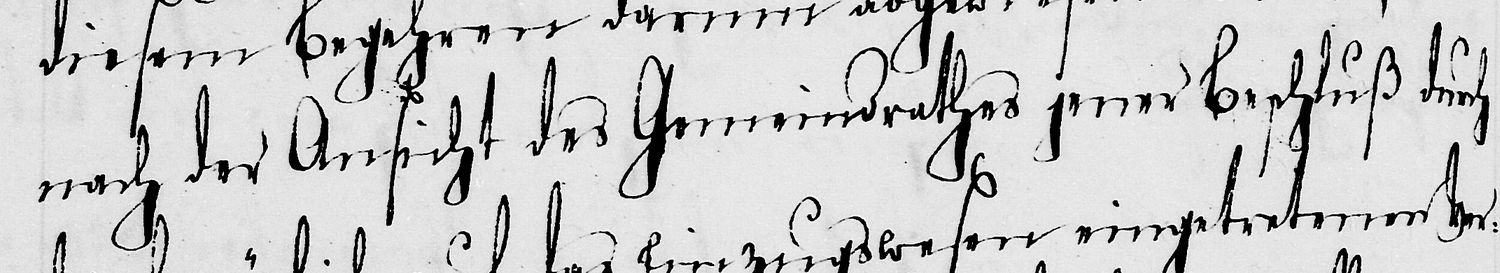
nach der Ansicht des Gemeindrathes jener Beschluß d¬
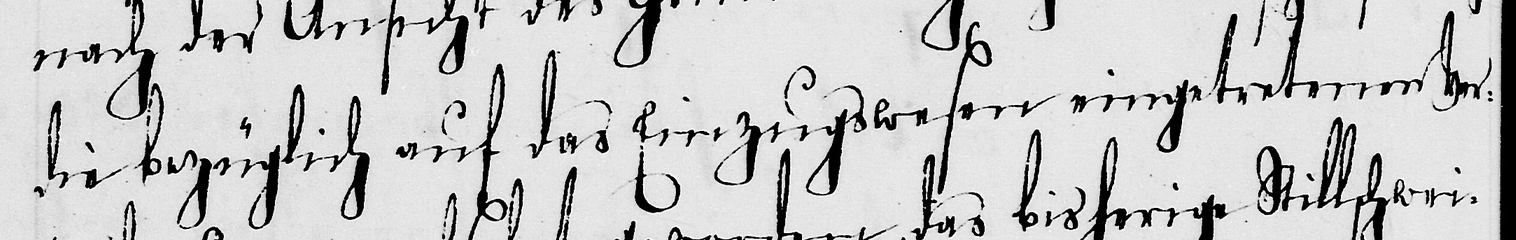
die bezüglich auf das Einzugswesen eingetretenen Ver¬
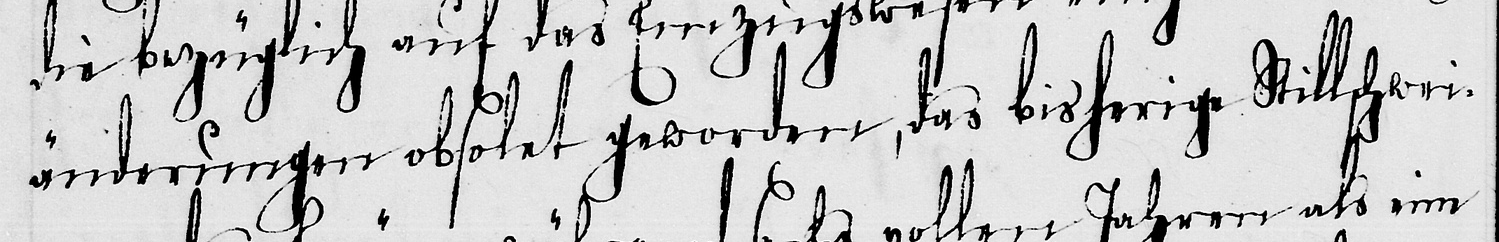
änderungen obsolet geworden, das bisherige Stillsch¬
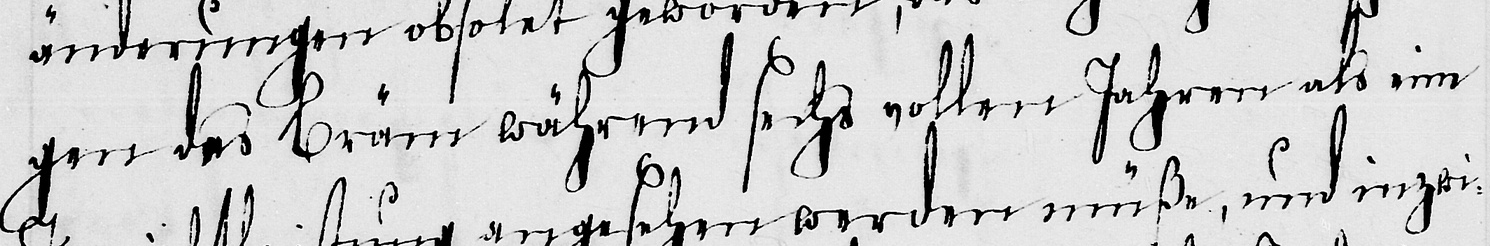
gen des Bräm während sechs vollen Jahren als eine
